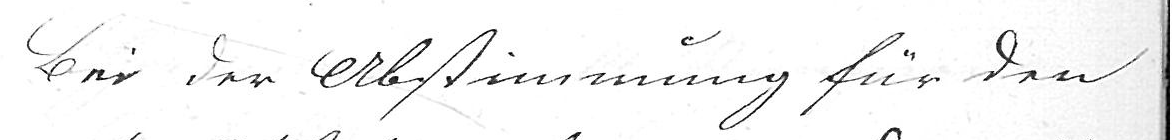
Bei der Abstimmung für den
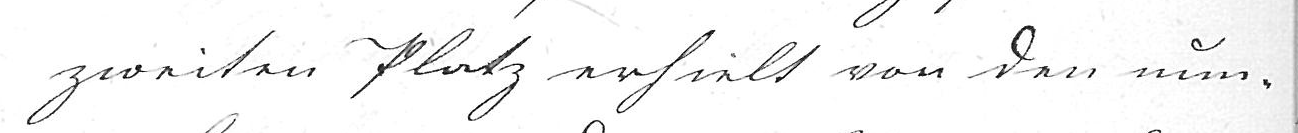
zweiten Platz erhielt von den nun-
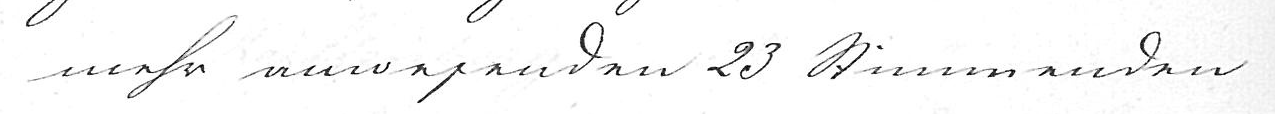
mehr anwesenden 23 Stimmenden
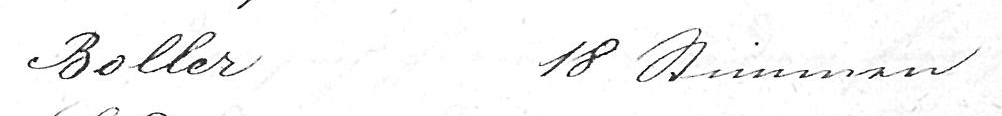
Boller 18 Stimmen
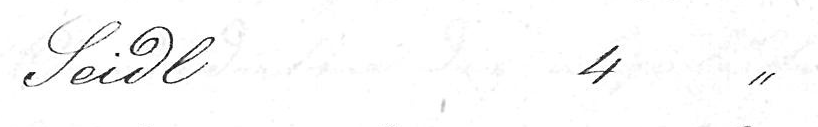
Seidl 4 "
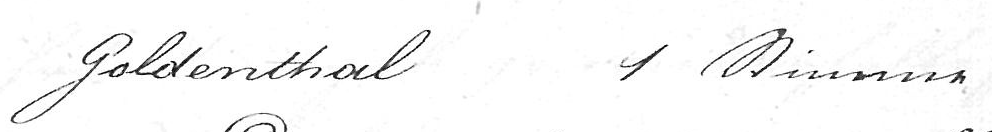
Goldenthal 1 Stimme
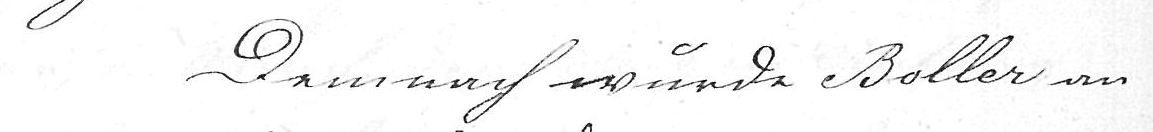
Dennach wurde Boller an
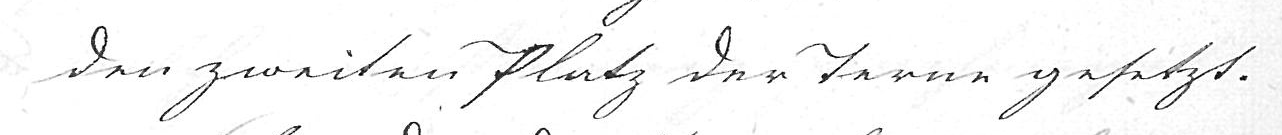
den zweiten Platz der Terne gesetzt.
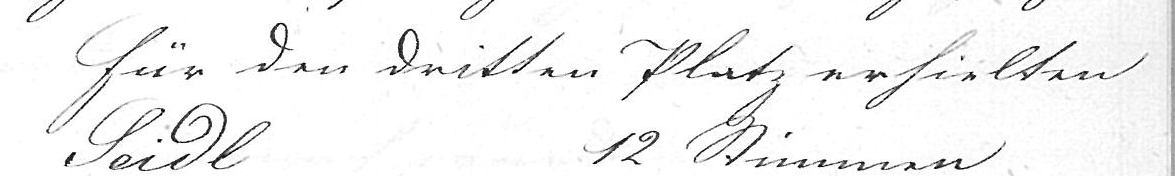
Für den dritten Platz erhielten
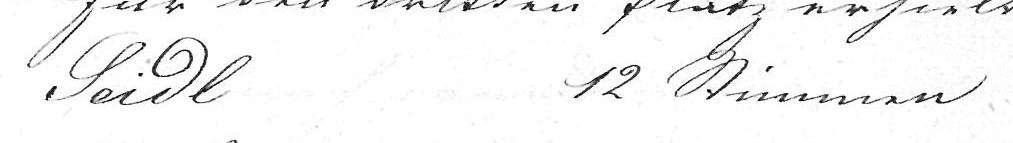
Seidl 12 Stimmen
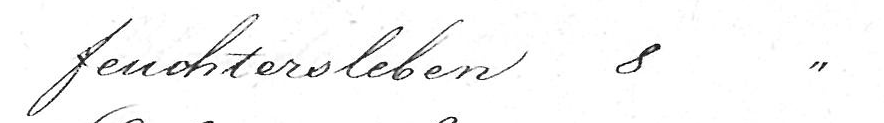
Feuchtersleben 8 "
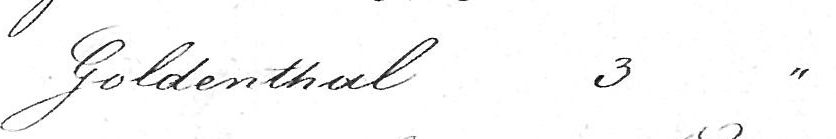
Goldenthal 3 "
